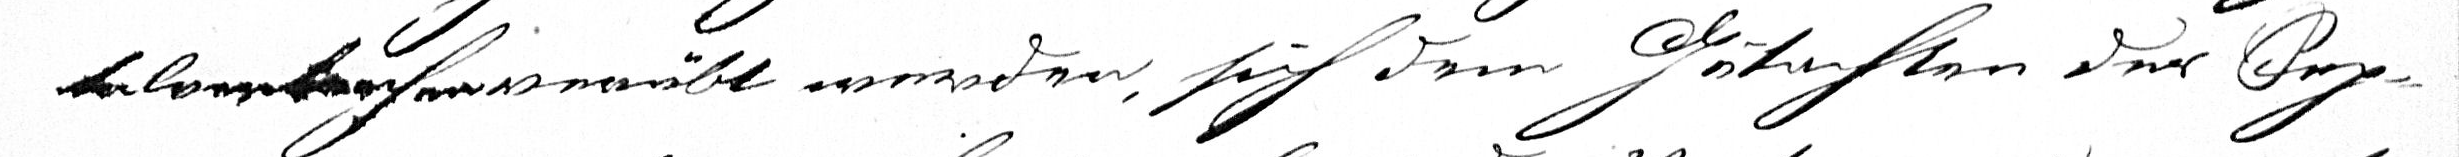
talverxx verübt werden, sich dem Gutachten der Sep¬
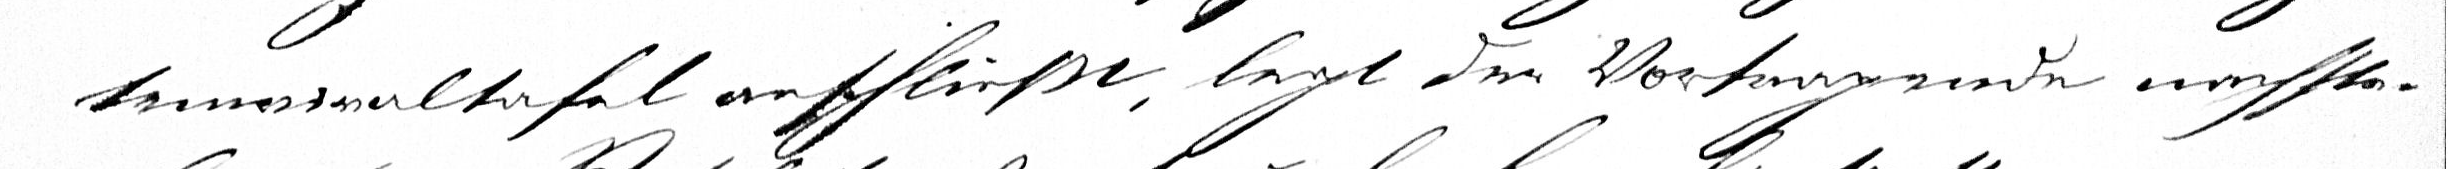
temviraltafel anschließt, legt der Vortragende nächste¬
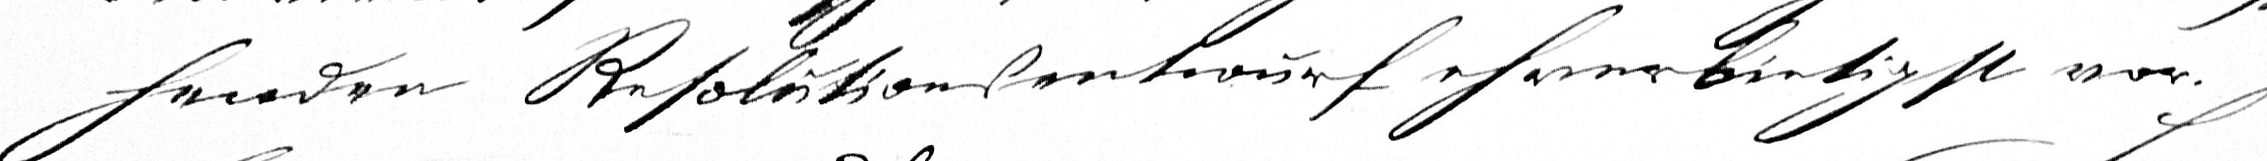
henden Resolutionsentwurf eherbiexx vor.
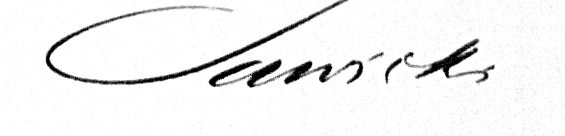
Sawicki
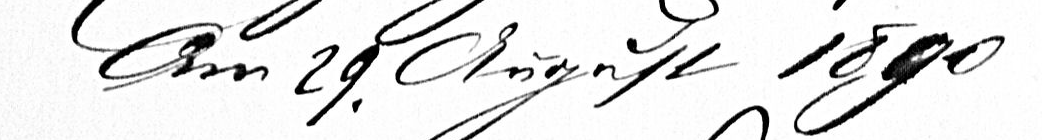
Am 29. August 1890
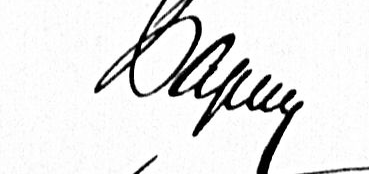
xx
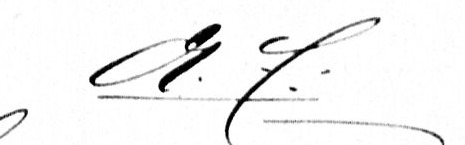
A. E.
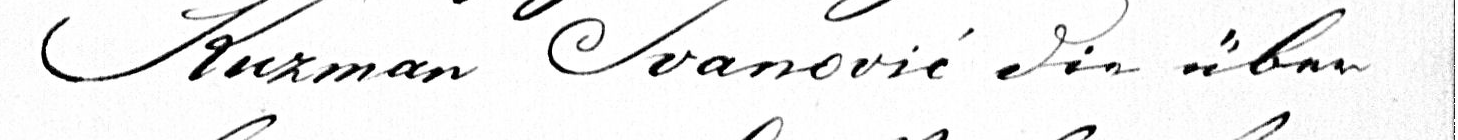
Kuzman Ivanović die über
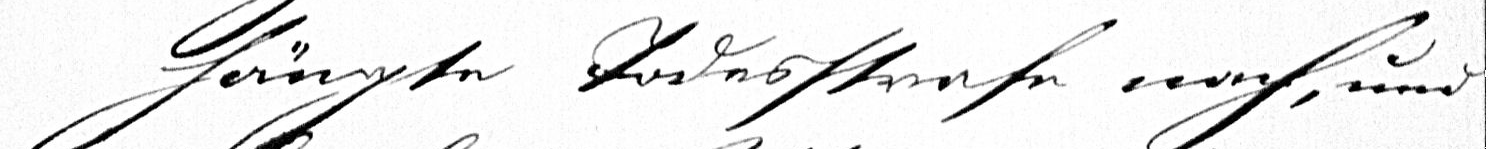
hängte Todesstrafe nach, und
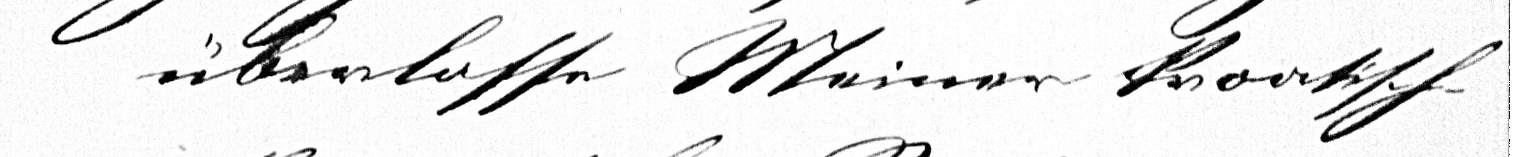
überlasse Meiner kroatisch¬
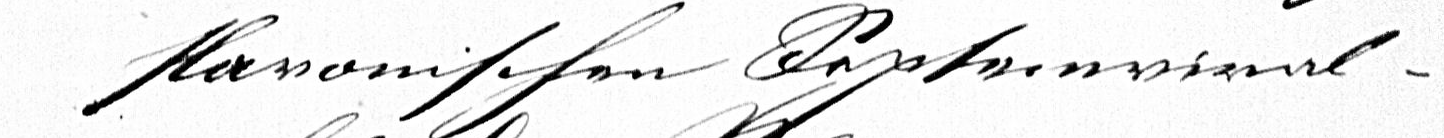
slavonischen Septemviral¬
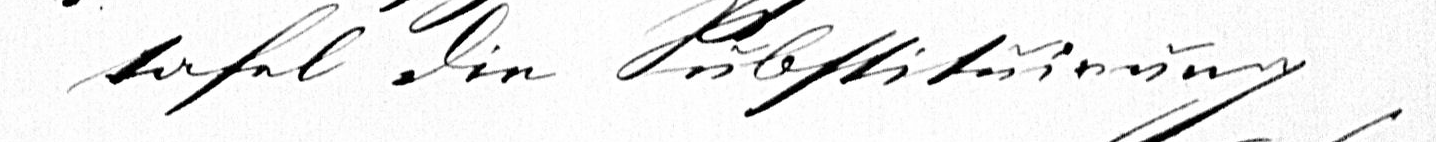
tafel die Substituirung
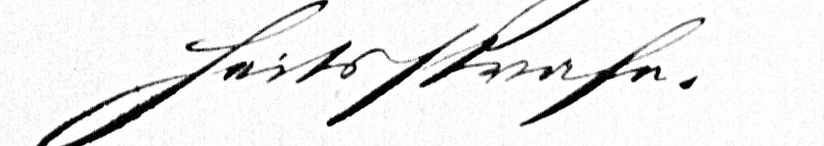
heitsstrafe.
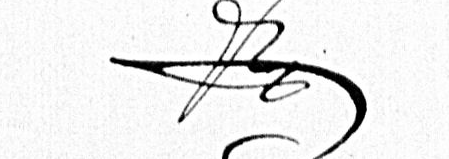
xx
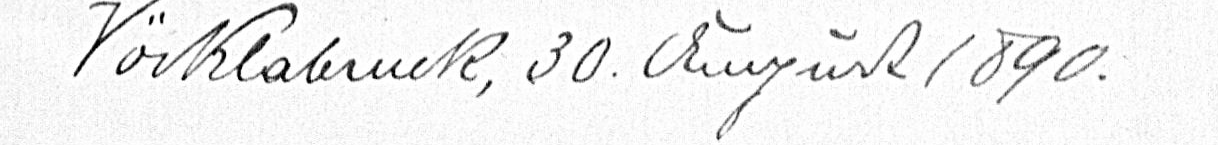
Vöcklabruck, 30. August 1890.
